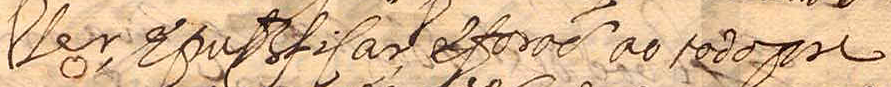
ler, E publiCar, e foraõ ao todo pre
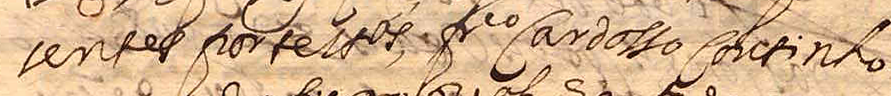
sentes por test.as, fr.co Cardosso Coutinho
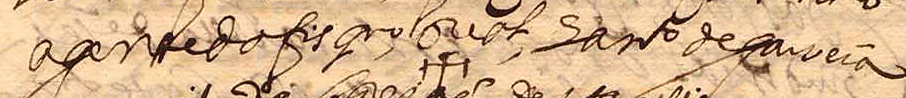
agente do fisquo Real, E anto de Gouveia
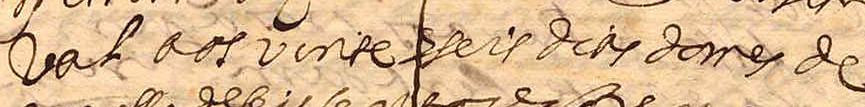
val aos vinte e seis dias do mes de
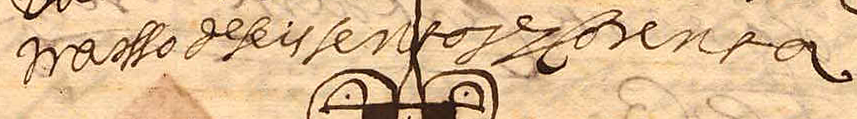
marsso de seissentos E Corenta
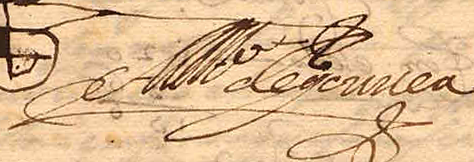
Anto de gouvea
